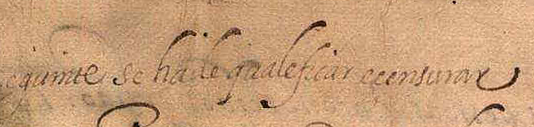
seguinte se ha de qualeficar e censurar
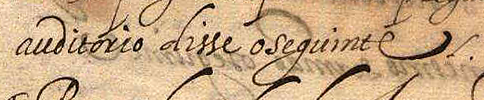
auditorio disse o seguinte /.
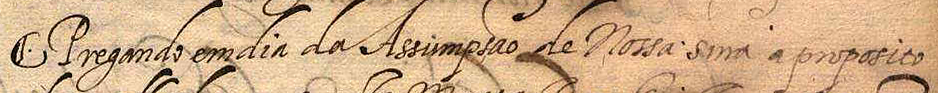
⁋ Pregando em dia da Assumpsão de Nossa sn̄ra a proposito
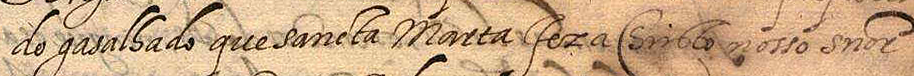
do gasalhado que sancta marta fez a Christo nosso snōr
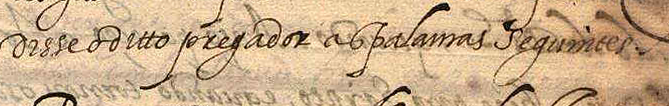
disse o ditto pregador as palauras seguintes. /
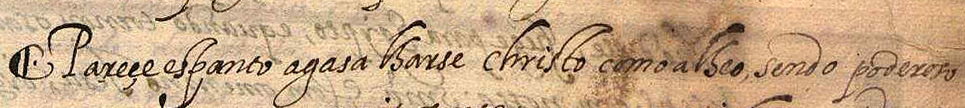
⁋ Parece espanto agasalharse christo como alheo, sendo poderoso
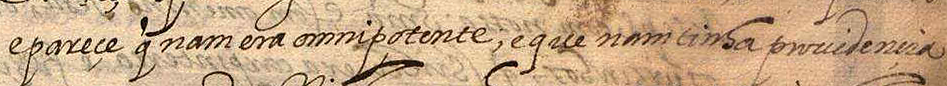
e parece q̄ nam era omnipotente; e que nam tinha prouidencia
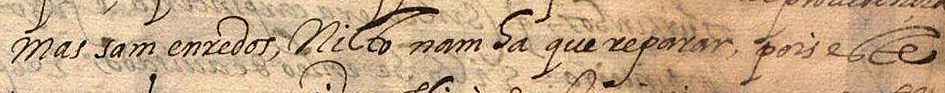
mas sam enredos, Nisto nam ha que reparar, pois este
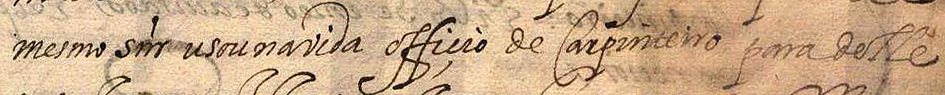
mesmo sn̄r usou na vida officio de Carpinteiro para delle
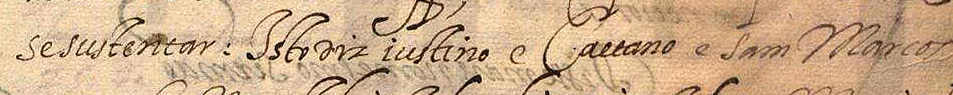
se sustentar: Isto diz iustino e Caetano e sam Marcos
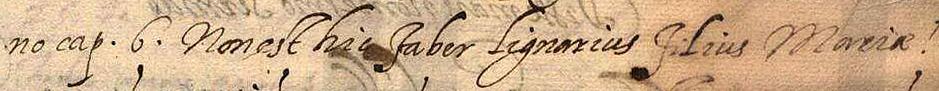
no cap. 6. non est hic faber lignarius filius Mariæ?
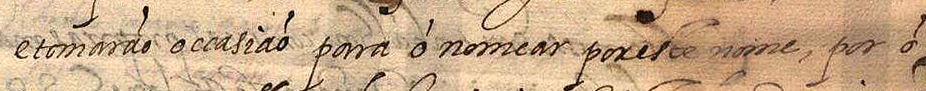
e tomarão occasiaõ para o nomear por este nome, por o
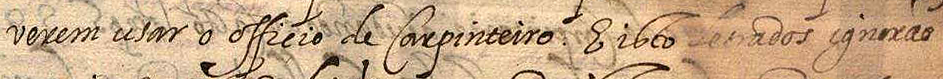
verem usar o officio de Carpinteiro. E isto letrados ignorão
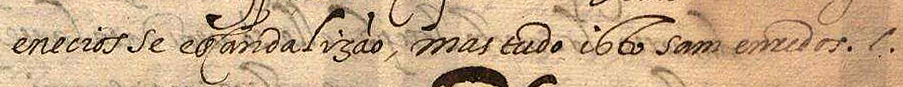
e necios se escandalizão, mas tudo isto sam enredos. /.
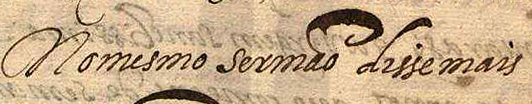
No mesmo sermão disse mais
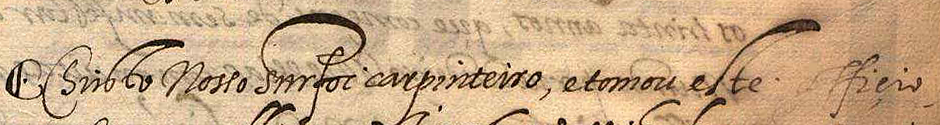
⁋ Christo Nosso sn̄r foi carpinteiro, e tomou este officio,
